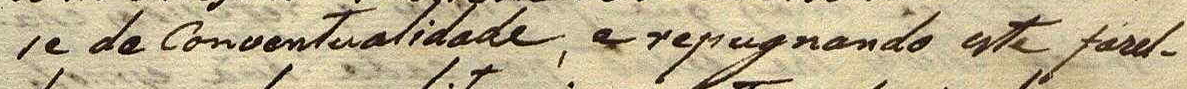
se de conventualidade, e repugnando este fazel
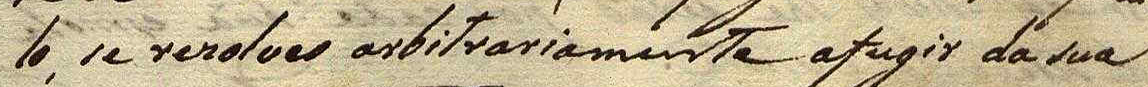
lo, se rezolveo arbitrariamente a fugir da sua
